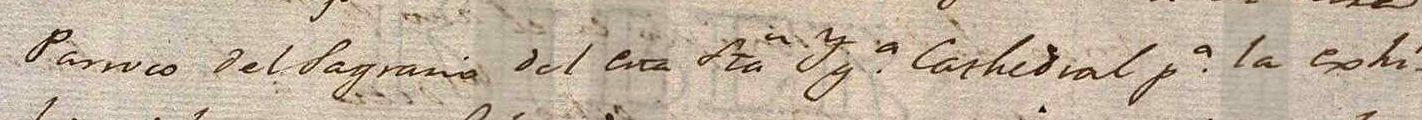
Parroco del Sagrario del esta stā Yg.a Cathedral p.a la exhi
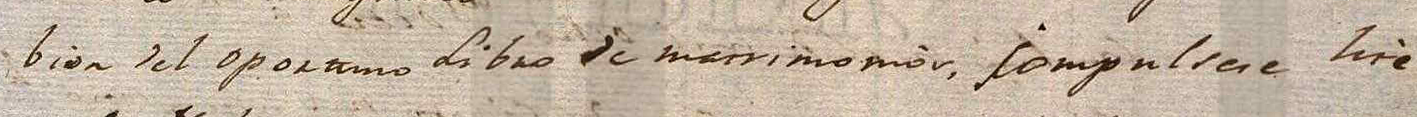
bion del oportuno Libro de matrimonios, Compulsese lite
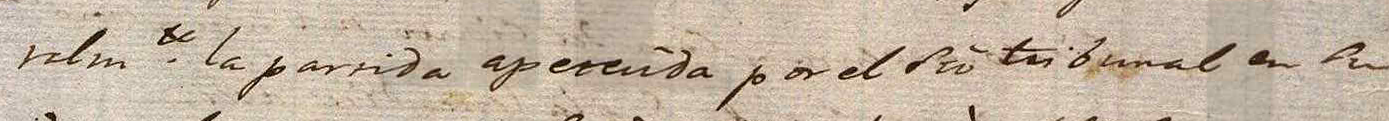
ralm.te la partida apetecida por el stō tribunal en su
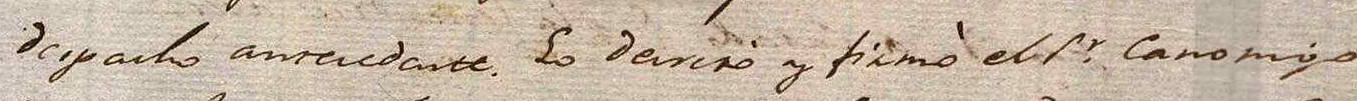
despacho antecedente. Lo decretó y firmò el S.r canonigo
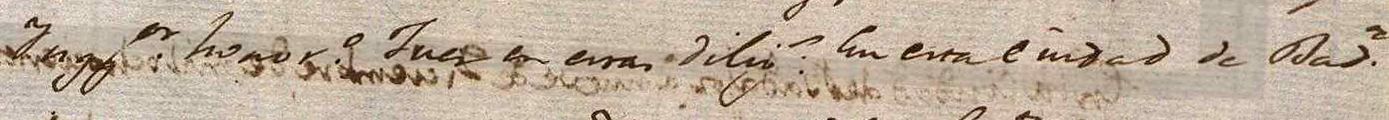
Ynqq.or honor.o Iuez en estas dilig.s En esta ciudad de Bad.z
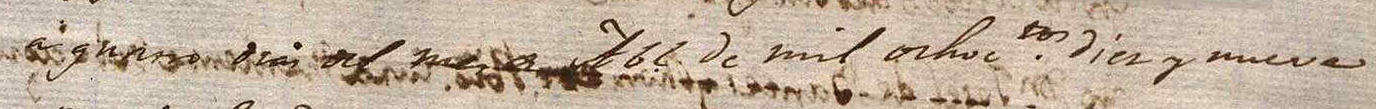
a quatro dias del mes de Abl. de mil ochoc.tos diez y nueve
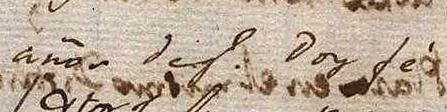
años de q.e doy fé
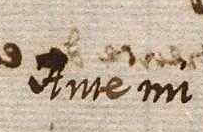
Ante mi
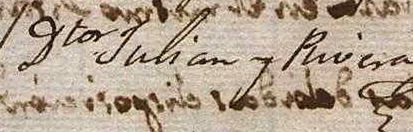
D.tor Iulian y Rivera
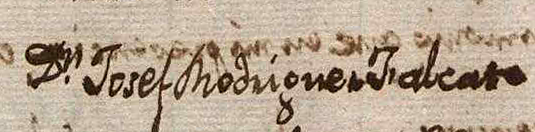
D.n Iosef Rodrigues Falcato
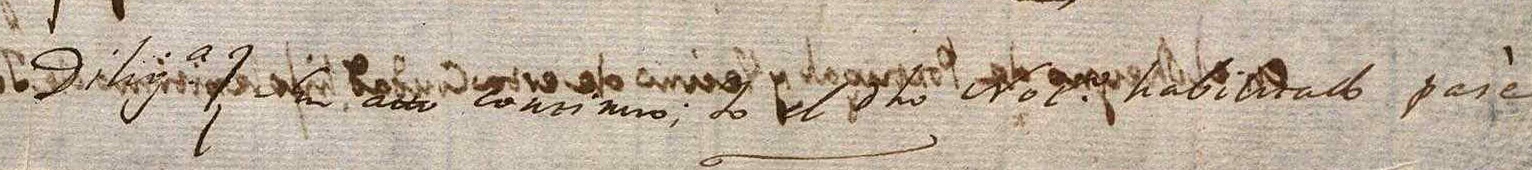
Dilig.a hecha acto continuo; Yo el dho Not.ro habilitado pasé
